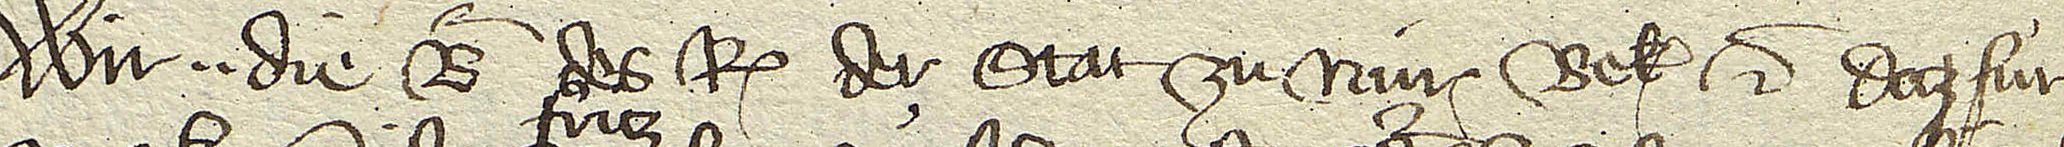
Wir ~ die B* des R* der Stat cʒu Nür* Bek* ec* daʒ für
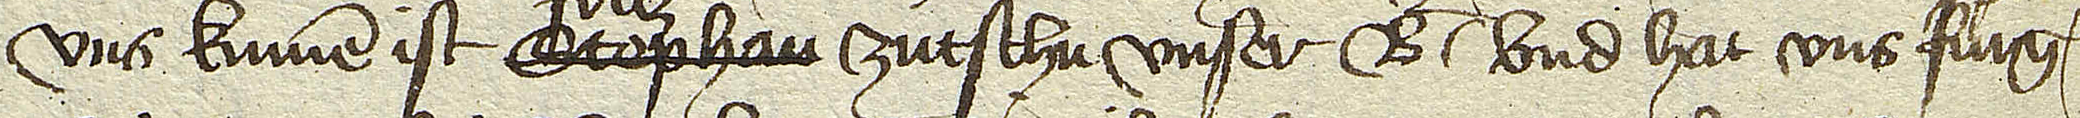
vns kume* iſt Stephan cʒütſchn vnſer B* / vnd hat vns fürg*
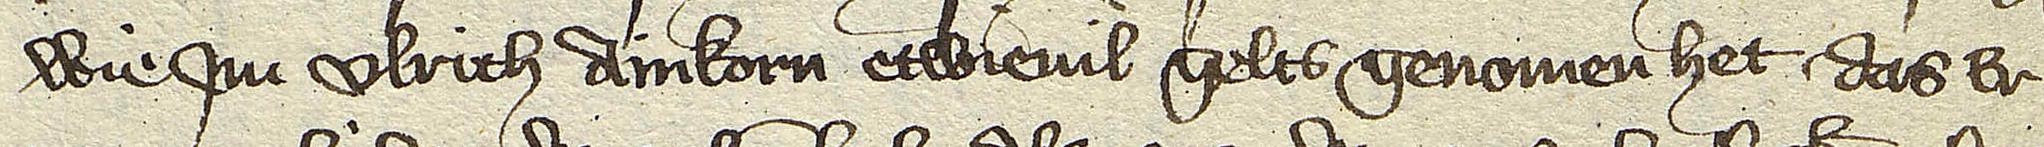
wie Im Vlrich Ainkorn etwieuil gelts genomen het / das Er
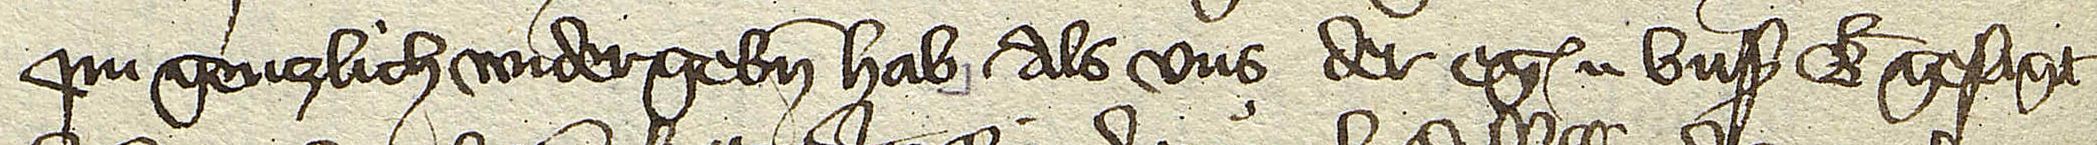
Im gencʒlich widergebn* hab / Als vns der eg* ~ vnſ* B* geſagt
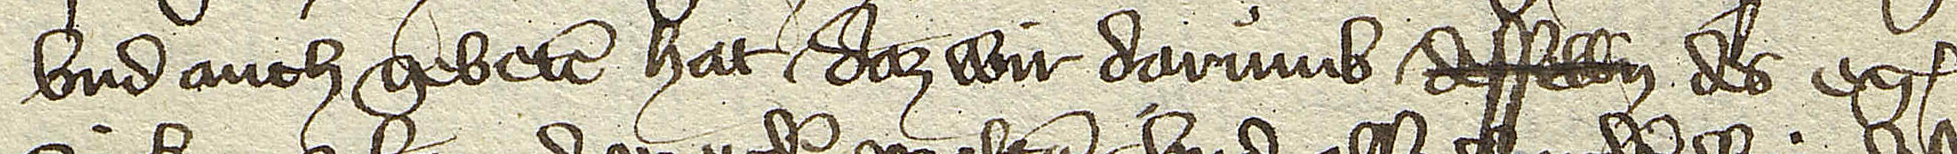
vnd auch gebete* hat / daʒ wir darümb / deſſelbn* des eg*
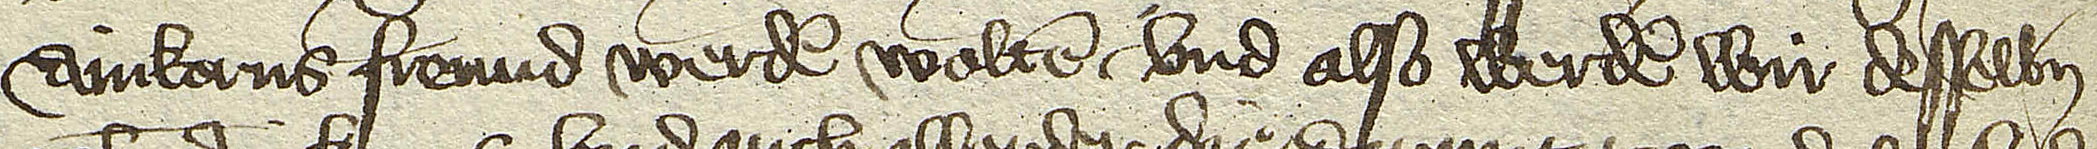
Ainkorns freund werde* wolte* / vnd alſo werd* wir deſſelbn*
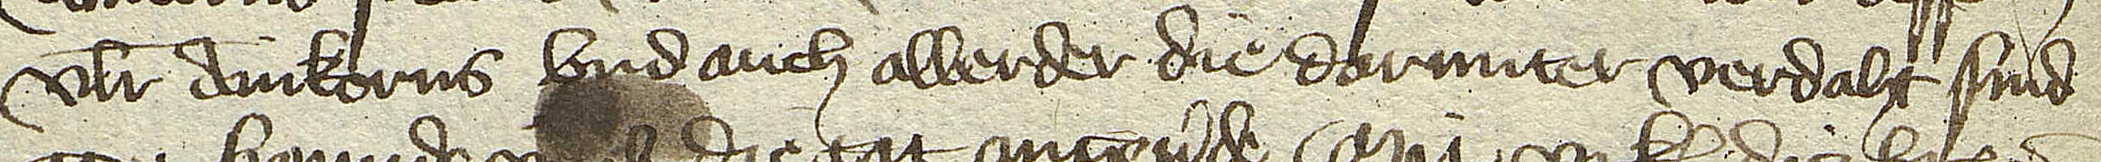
vlr* Ainkorns vnd auch aller der die darunter verdaht ſind
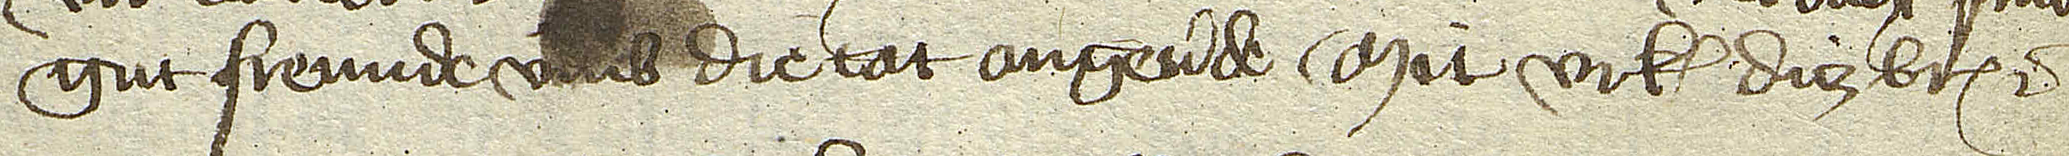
gut freunde v̈mb die tat angeu*de / Mit vrk* dicʒ br* ec*
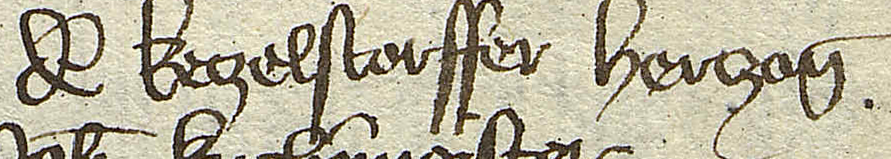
De* kecʒelſtorffer hercʒog .
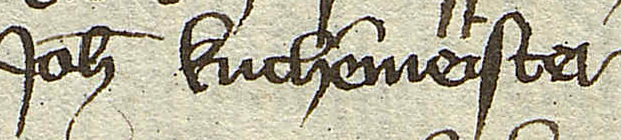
Ioh* kuche*meiſter
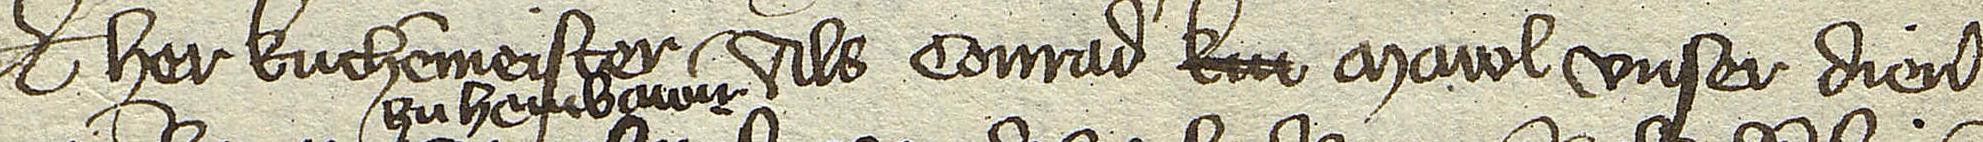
L* her kuche*meiſter / Als Conrad ku Mawl vnſer dien*
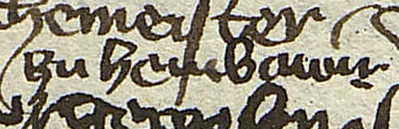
cʒu hentbawn
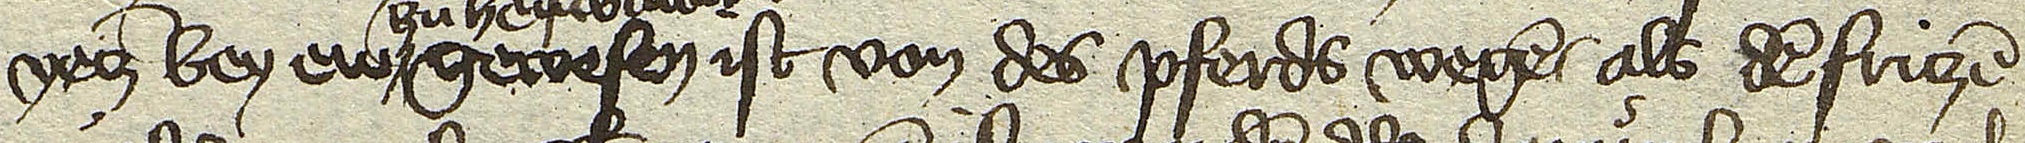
yecʒ* bey ew geweſen iſt von des pferds wege* / als de* fricʒe*
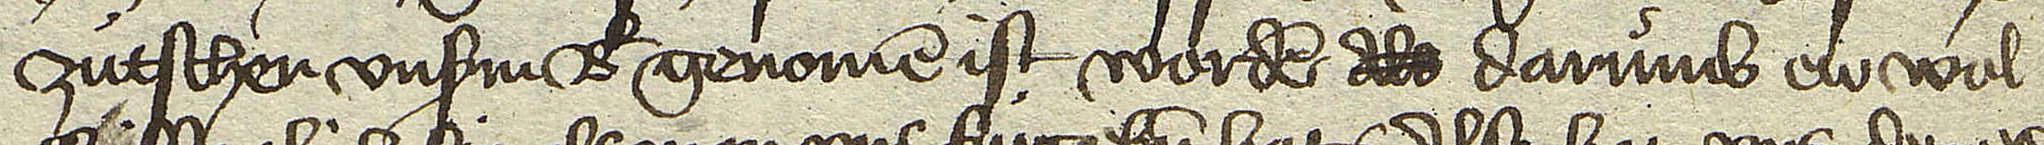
cʒütſchen vnſ*m B* genome* iſt worde* Als darümb ew wol
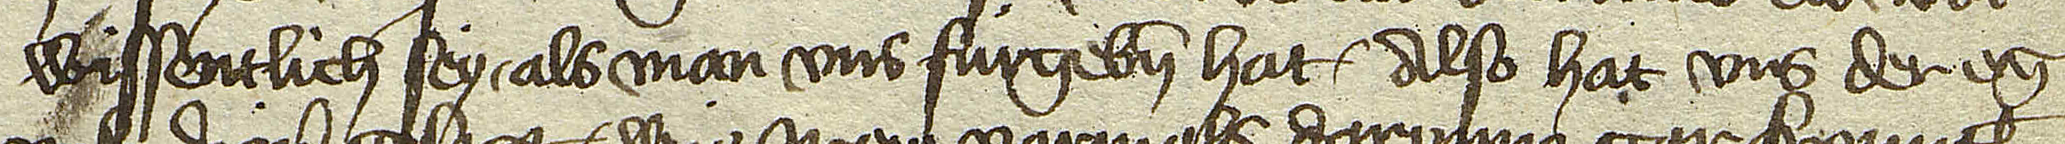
wiſſentlich ſey / als man vns fürgebn* hat / Alſo hat vns der eg*
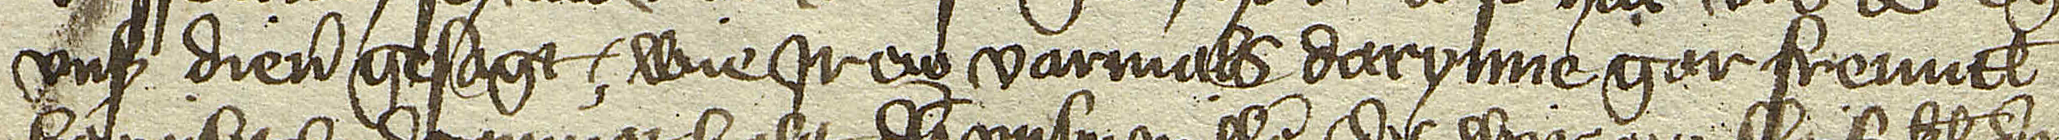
vnſ* dien* geſagt / wie Ir ew vormals darynne gar freuntl*
